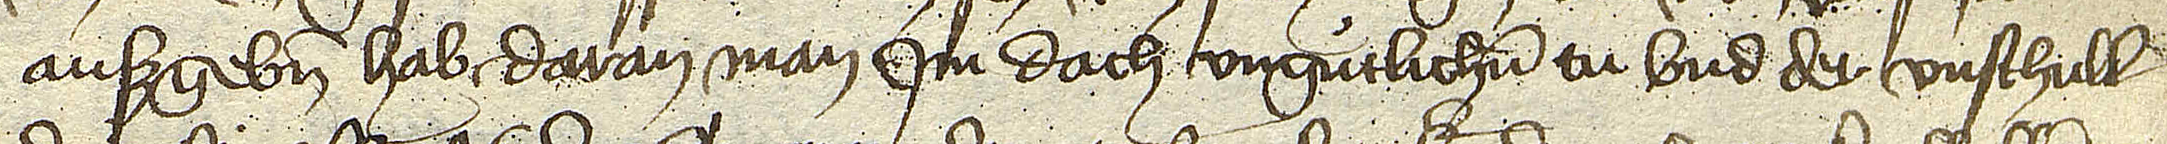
auſʒgebn* hab / daran man Im doch vngütlichn* tu vnd der vnſchull
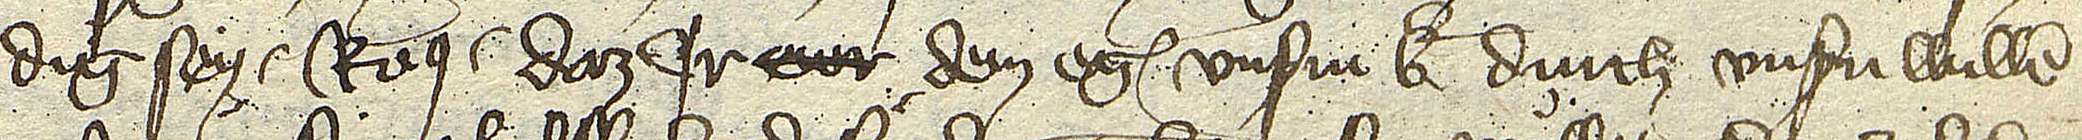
dig ſey / Ro* / daʒ Ir ewr dem eg* vnſ*m B* durch vnſ*n wille*
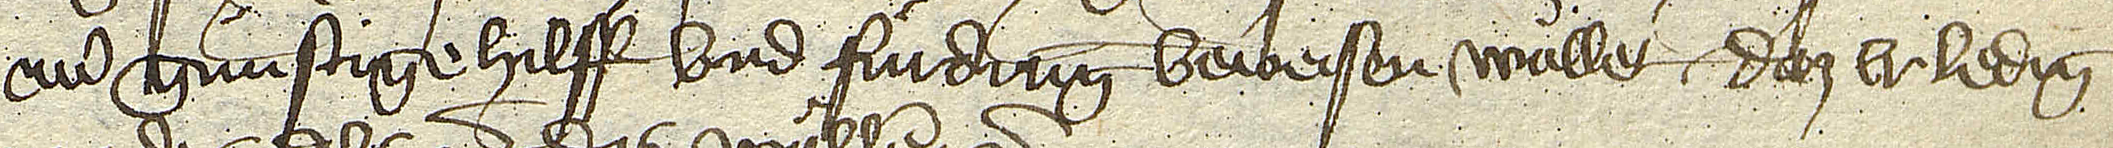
ew* günſtige hilff vnd fürdrug beweiſen wöllet / daʒ Er ledig
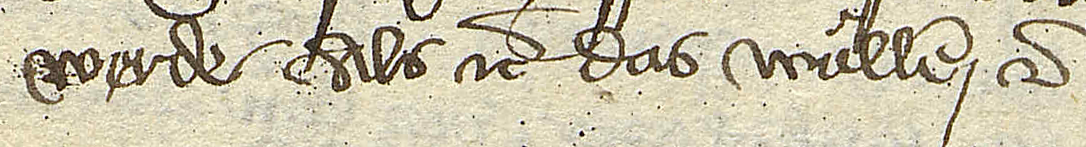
werde / Als ec* das wölle* ec*
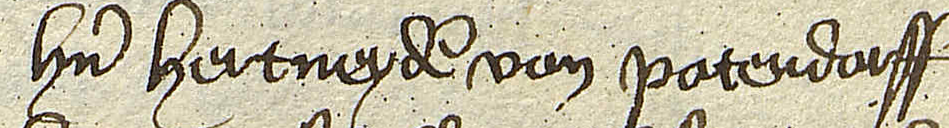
hn* Hertneyd* von potendorff
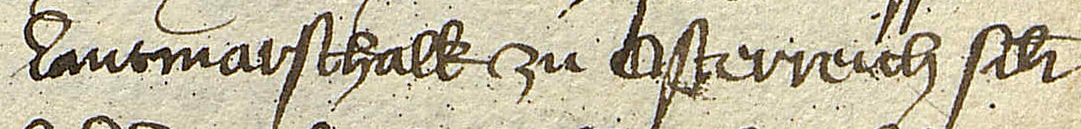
lantmarſchalk cʒu Oſterreich ſilr*
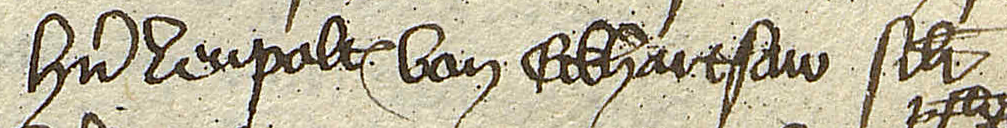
hn* Leupolt* von Eckhartſaw ſilr*
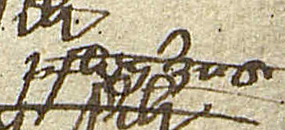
pfleg* cʒus
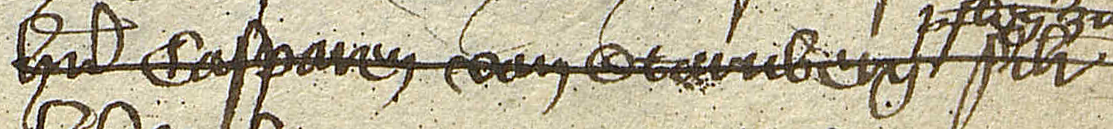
hn* Caſparen von Starnberg ſilr*
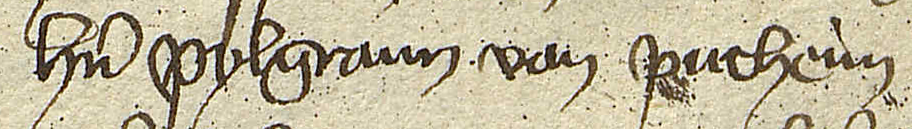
hn* Pylgraun von pucheim
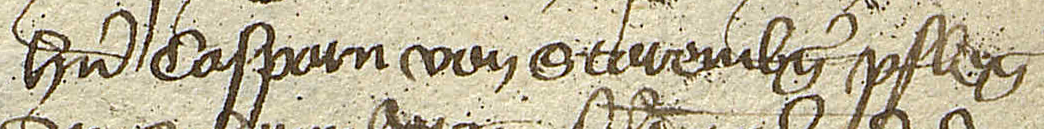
hn* Caſparn von Starembg* pfleg*
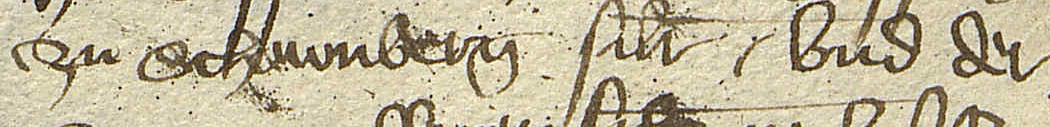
cʒu Schawnberg ſilr* / vnd der
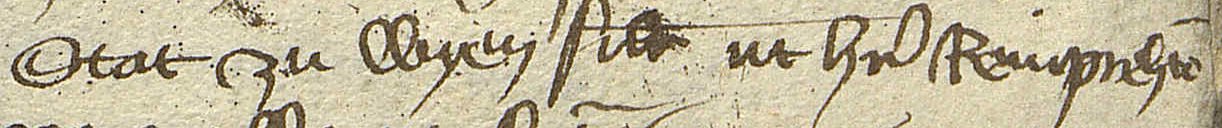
Stat cʒu wyen ſilr* ut hn* Reinprechte*
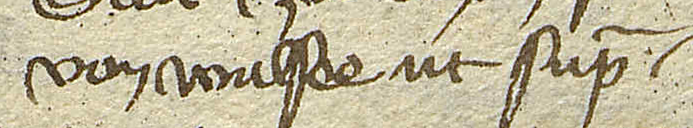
von walſee ut ſup* /
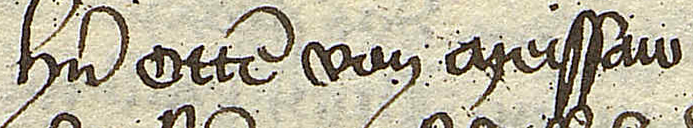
hn* Otte* von Meiſſaw
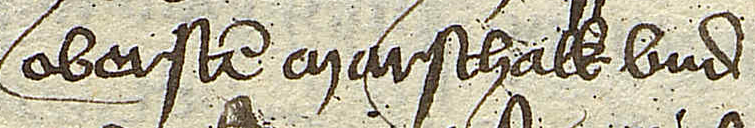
oberſte* Marſchalk vnd
